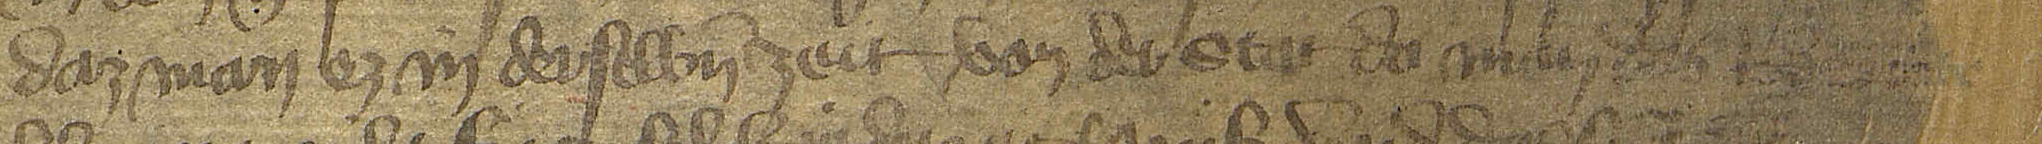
daʒ man eʒ in derſelbn* cʒeit von der Stat do man das %%%%%%
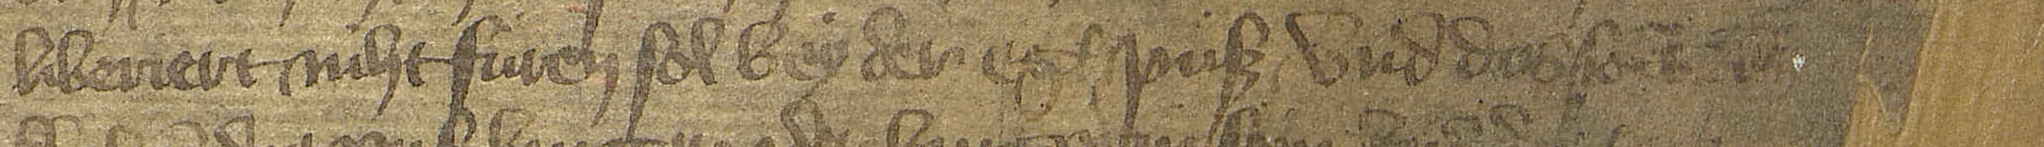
liberiert niht füren ſol bey der eg* püſʒ / Vnd das ſo%%%%%%%
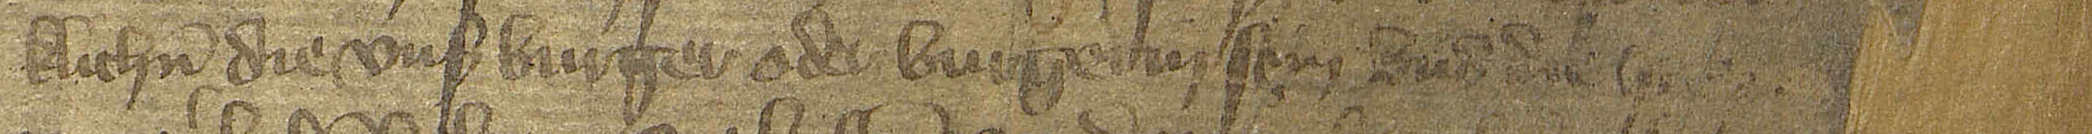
klichn* die vnſ* burger oder burgerin ſein vnd die Iren %%%%%%
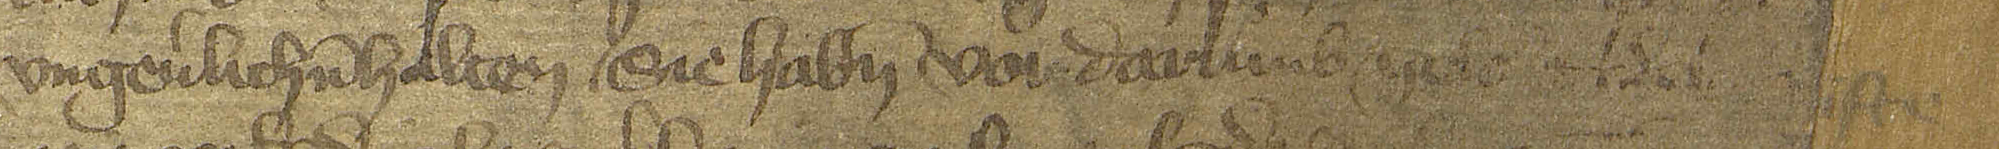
vngeu*lichn* halten / Sie habn* vor darümb gel%%%%%%%%%
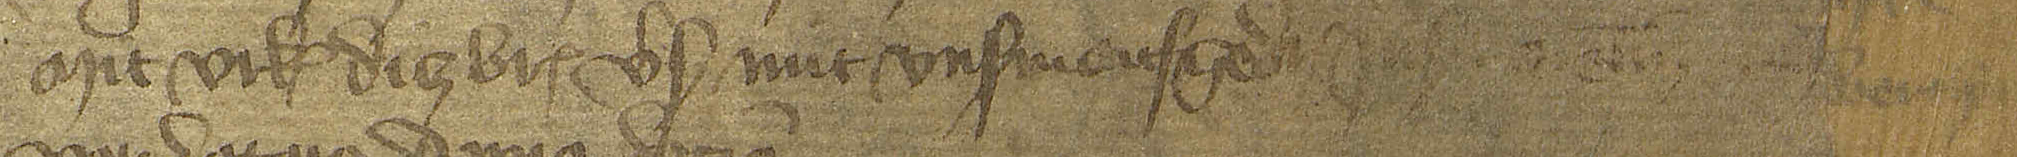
Mit vrk* dicʒ br* v*ſ* mit vnſ*m aufgedr* Inſ* %%%%%%%%%%
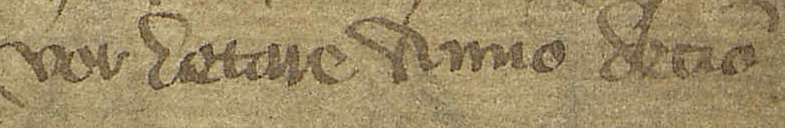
vor Letare Anno decio*
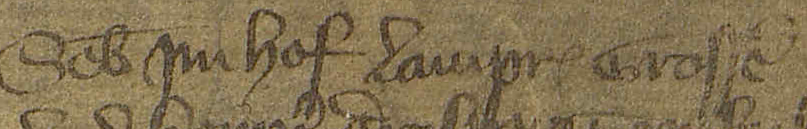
Seb* Im hof laupr* Groſſe*
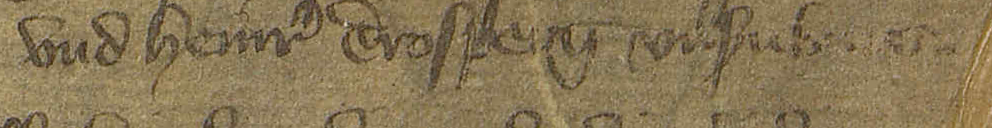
vnd heinr* Troſperg vnſ*n burg*
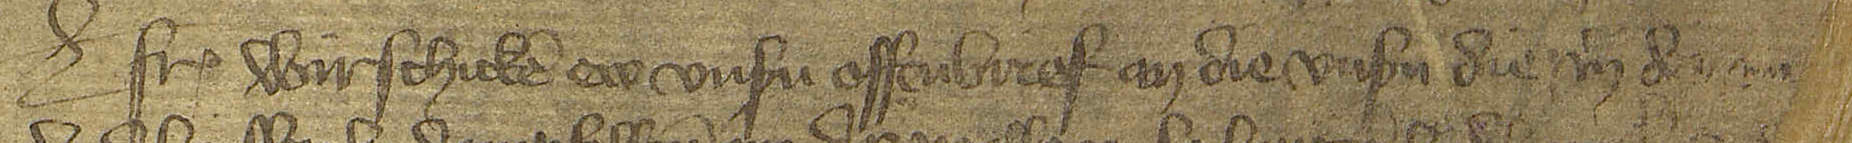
L* fr* wir ſchicke* ew vnſ*n offenbrief an die vnſ*n die in d%% %%
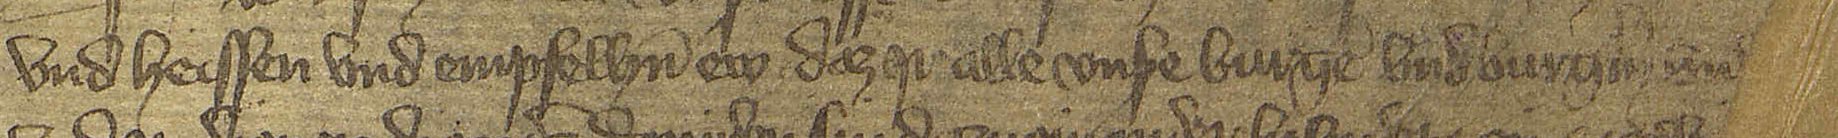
vnd heiſſen vnd empfelhn* ew daʒ Ir alle vnſ*e burge* vnd burg*in vnd %%%
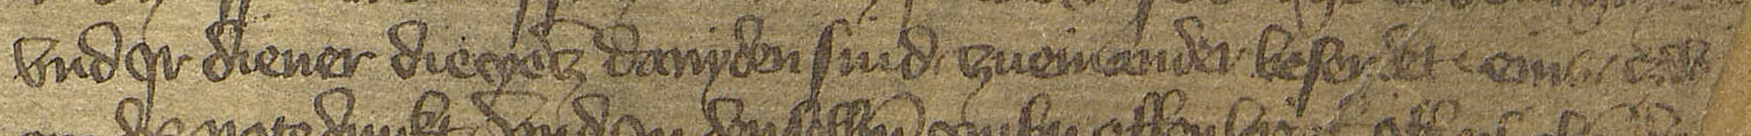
vnd Ir diener die yecʒ* danyden ſind cʒueinander beſendet / eins / cʒw%%%
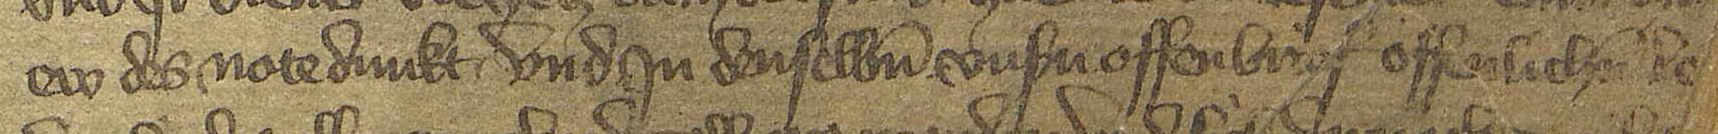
ew des note dunkt / Vnd In denſelbn* vnſ*n offenbrief offenlichn* le%%%%
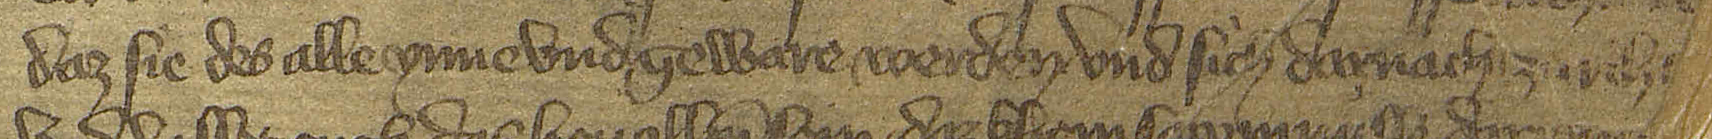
daʒ ſie des alle ynne vnd geware werden vnd ſich darnach cʒu rihten %%%%%%
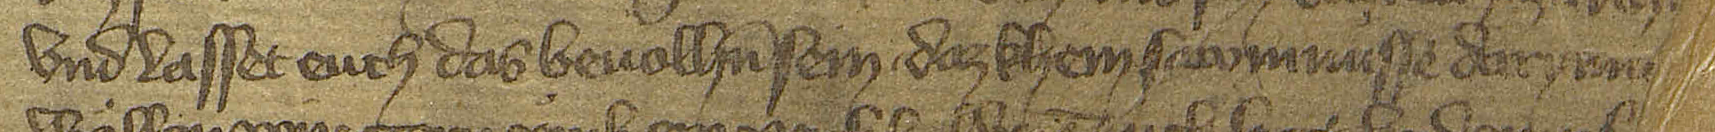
vnd laſſet euch das beuolhn* ſein / daʒ khein ſawmnüſſe darynne %%%%%%
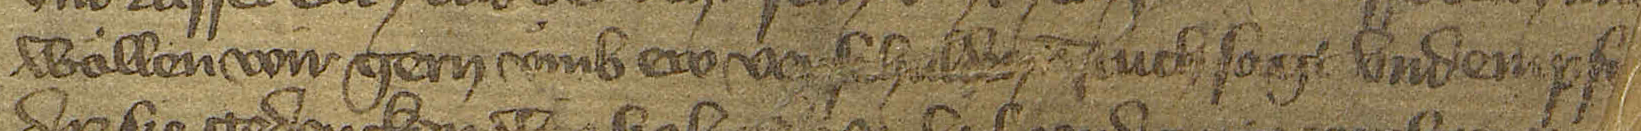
wöllen wir gern mb ew verſchulen / Auch ſagt vnd empf%%%%%%%%%
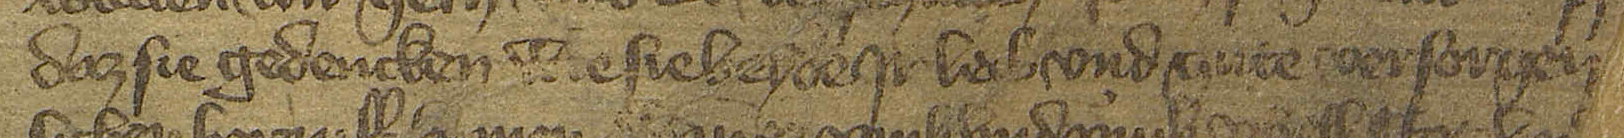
daʒ ſie gedencken wie ſie beyde Ir leib vnd gute verſorgen %%%%%%%%
